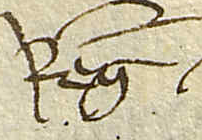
Reg* /
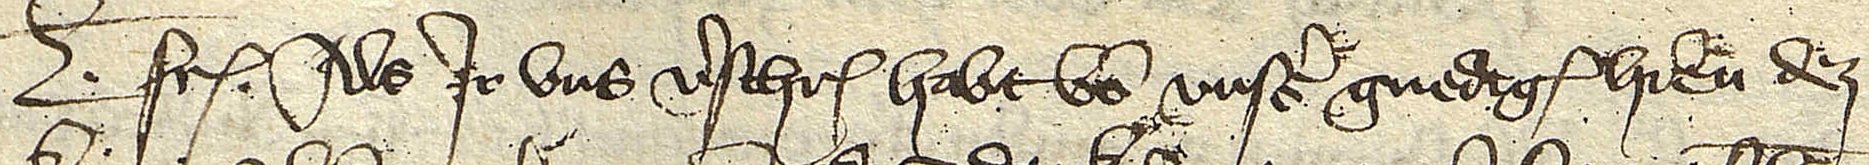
L*. fr*. Als Ir vns v*ſchr* habt vo* vnſs* gnedig* hr*en deʒ
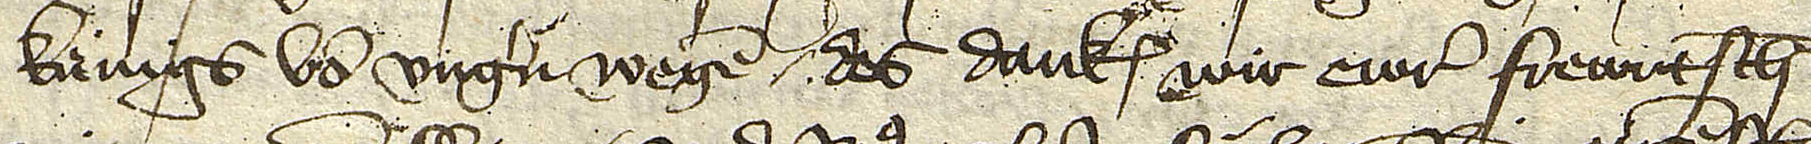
künigs vo* vng*n wege* / des dank* wir ewr* frewntſch*
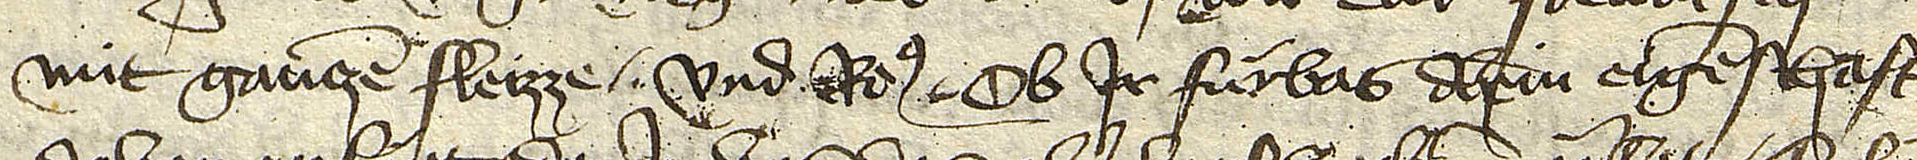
mit gancʒe* fleiʒʒe / . vnd Ro* / Ob Ir fürbas dhein eige*ſchaft
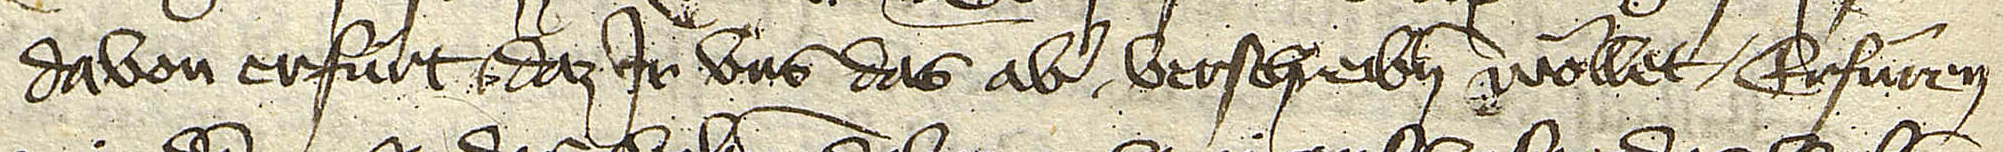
davon erfürt / daʒ Ir vns das ab* / verſchreibn* wöllet / Erfüren
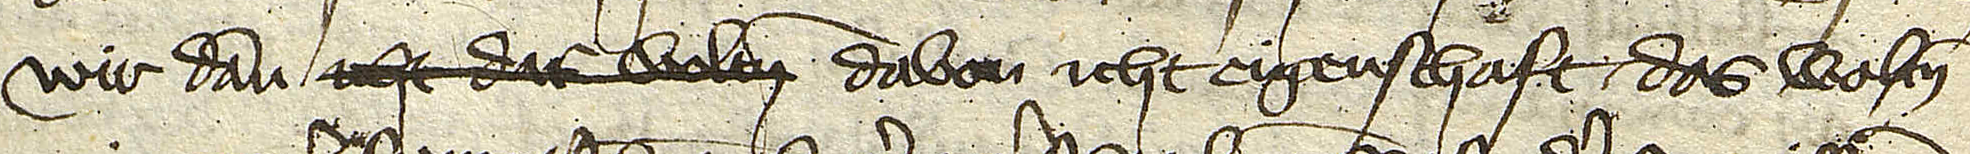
wir dan* icht das woltn* davon icht eigenſchaft / das woltn*
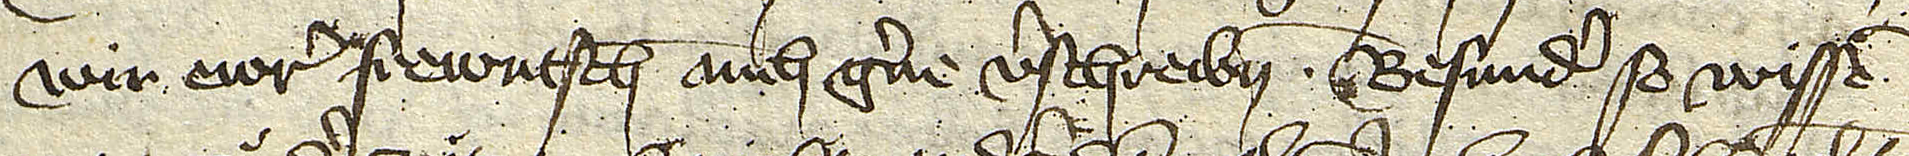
wir ewr* frewntſch* auch g*ne v*ſchreibn* . Beſund* ſo wiſſe*
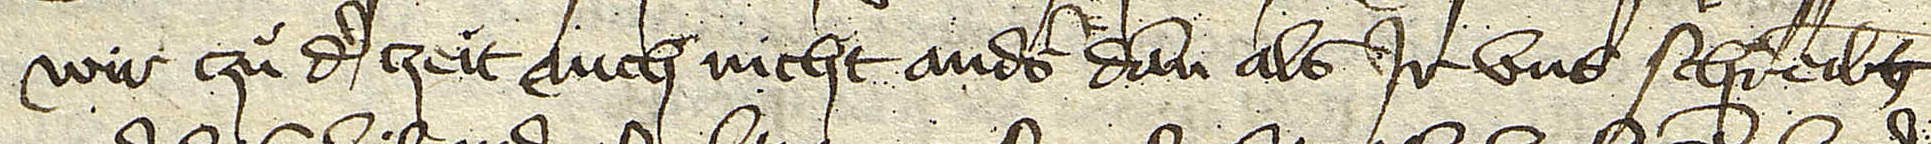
wir cʒü d* cʒeit auch nicht ands* dan* als Ir vns ſchreibt
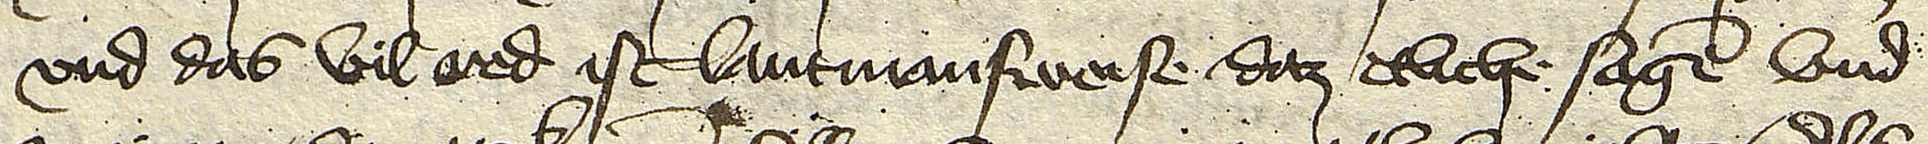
vnd das vil red iſt lantmanſweiſe/ daʒ etliche ſage* vnd
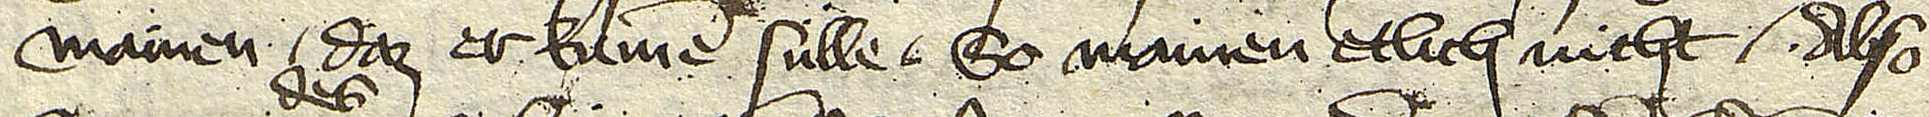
mainen / daʒ er kume* ſülle / So mainen etlich nicht / Alſo
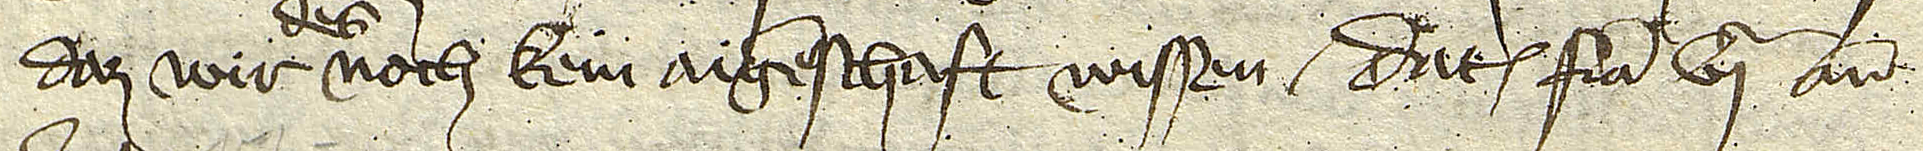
daʒ wir noch kein aige*ſchaft wiſſen / Dat* fia* vi* an*
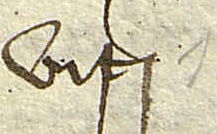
viti*
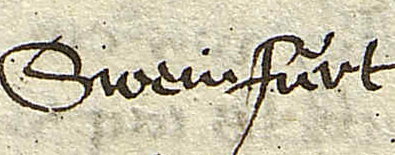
Sweinfürt
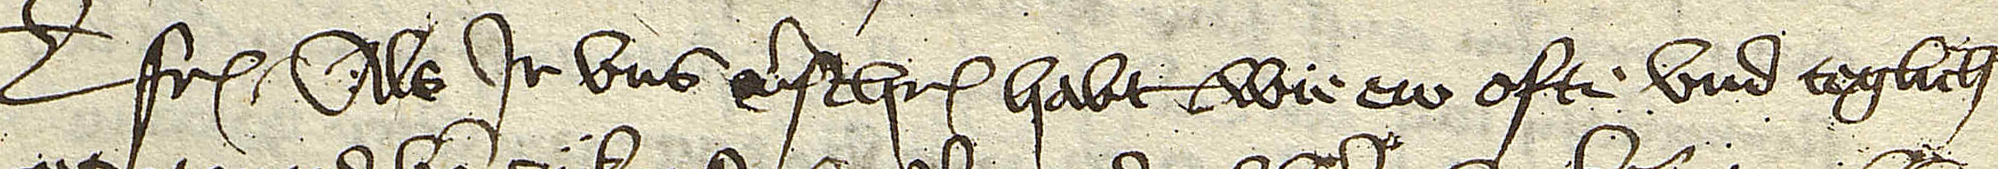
L* fr* / Als Ir vns v*ſchr* habt / wie ew ofte vnd teglich
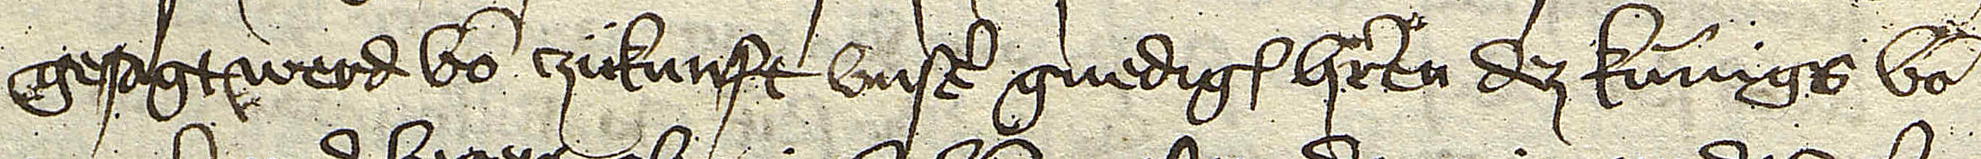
geſagt werd vo* cʒükunft vnſs* gnedig* hr*en deʒ künigs vo*
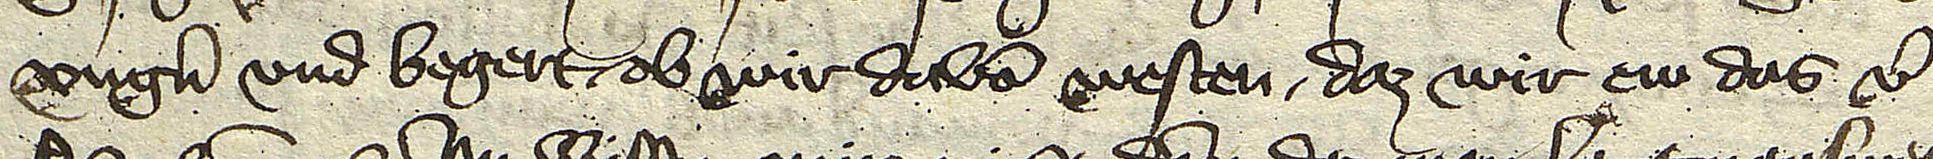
vngn* vnd Begert / ob wir davo* weſten / daʒ wir ew das v*
